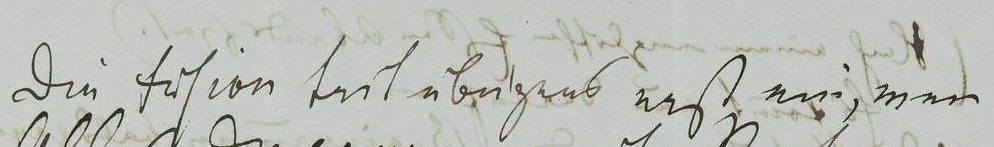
Die Fusion trit übrigens erst ein, wenn
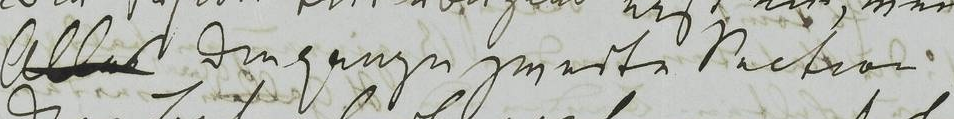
Alles die ganze zweite Section
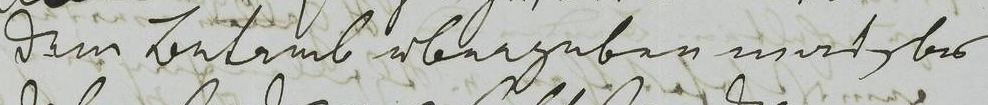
dem Betrieb übergeben wird, bis
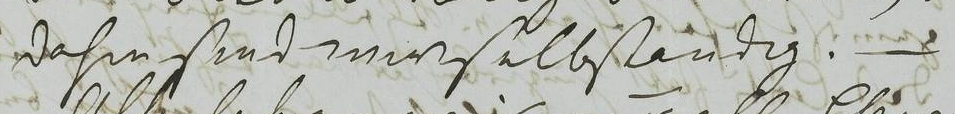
dahin sind wir selbständig. –
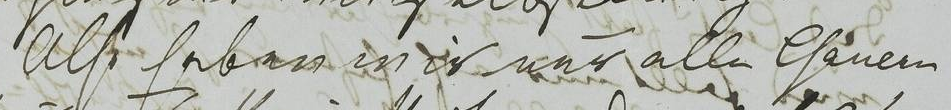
Also haben wir nur alle Chancen
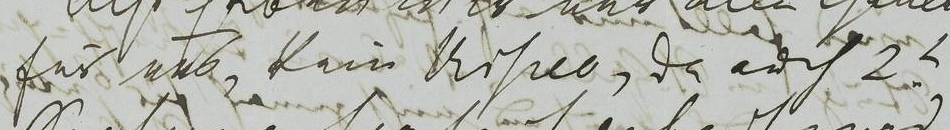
für uns, kein Risico, da auch 2te
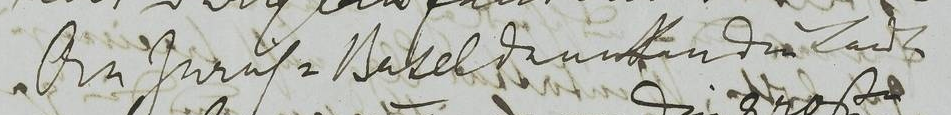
An Zürich– Basel dencken die Leute
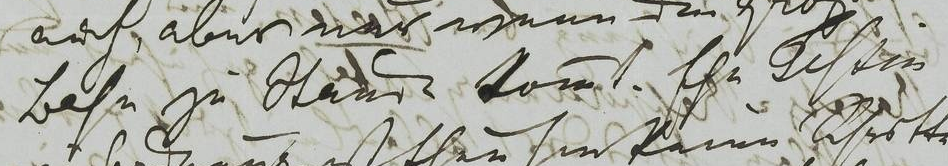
Bahn zu Stande kommt. Ehe Tessin
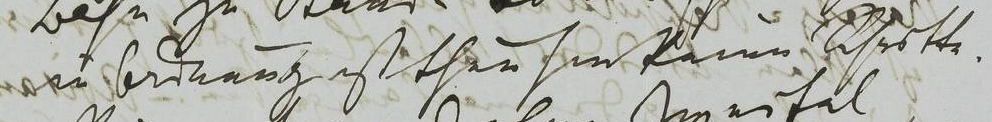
in Ordnung ist thun sie keine Schritte.
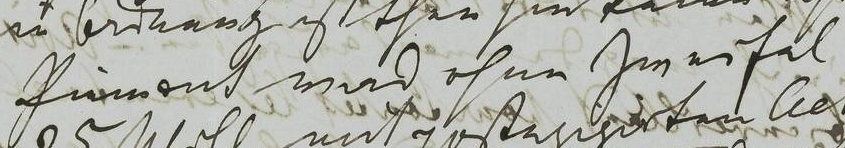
Piemont wird ohne Zweifel
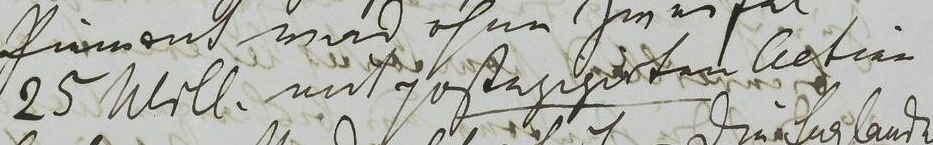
25 Mill. mit postezipierten Actien
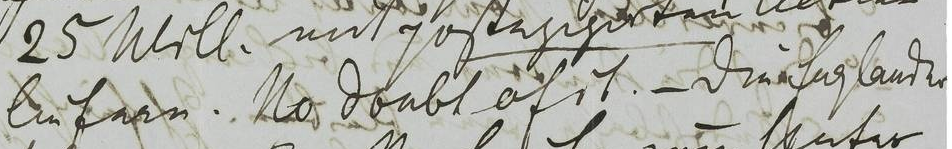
liefern. No doubt of it. – Die Engländer
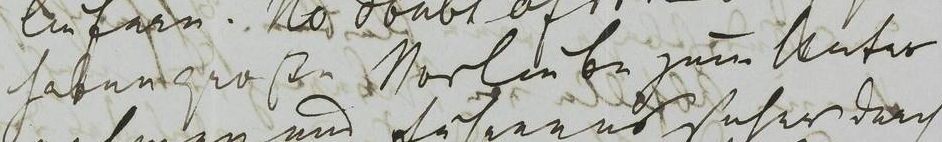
haben große Vorliebe zum Unter-
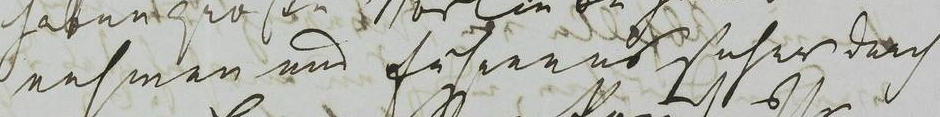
nehmen und führen es sicher durch
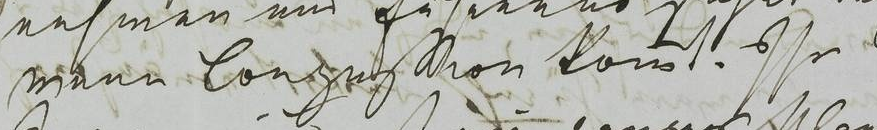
wenn Conzession kommt. Ihr
